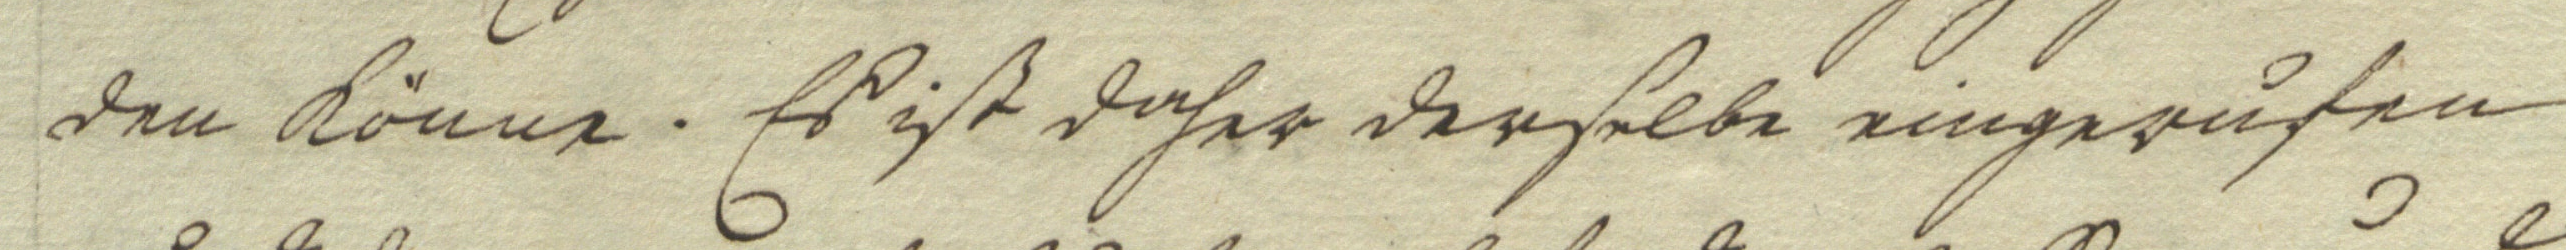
den könne. Es ist daher derselbe eingerufen
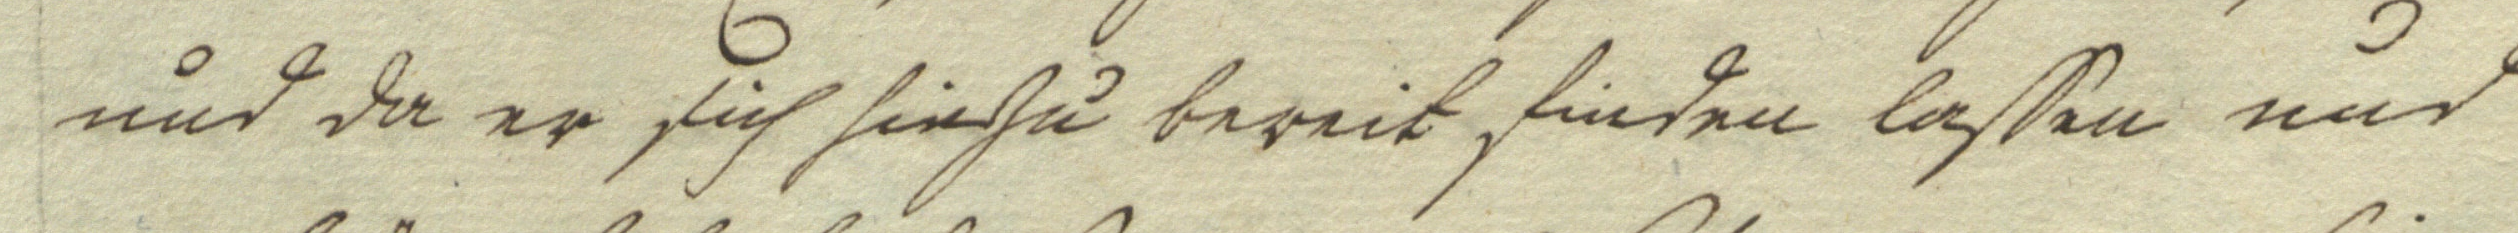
und da er sich hiezu bereit finden lassen und
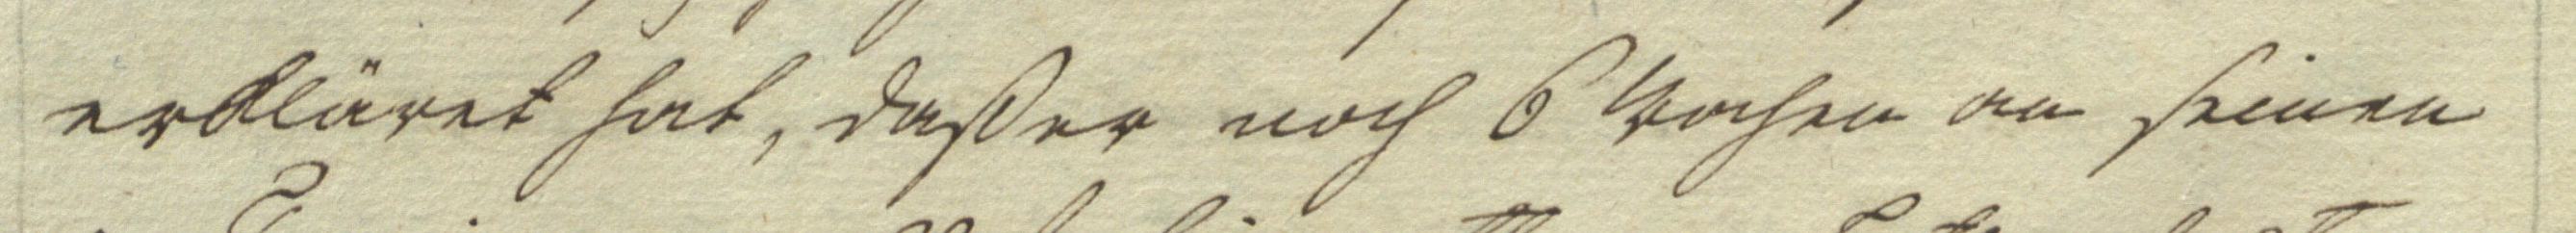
erkläret hat, daß er noch 6 Wochen an seinen
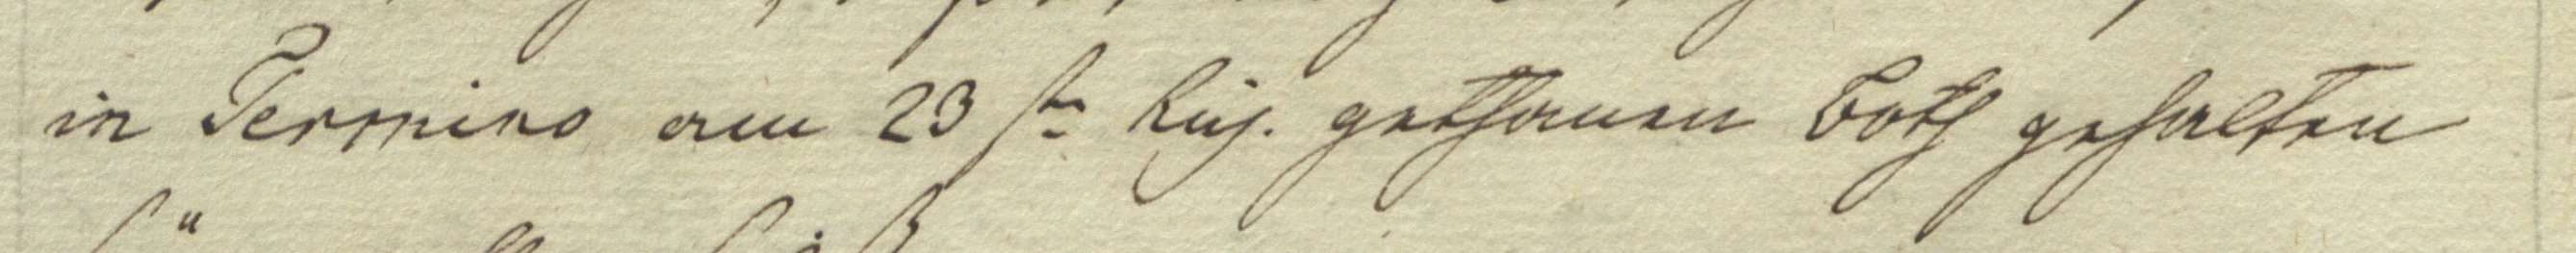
in Termino am 23 st huj. gethanen Both gehalten
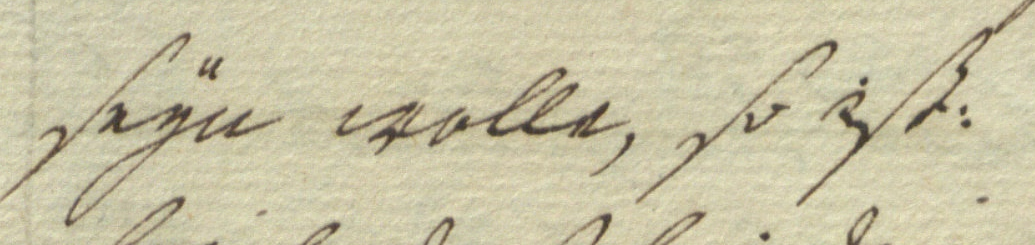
seÿn wolle, so ist:
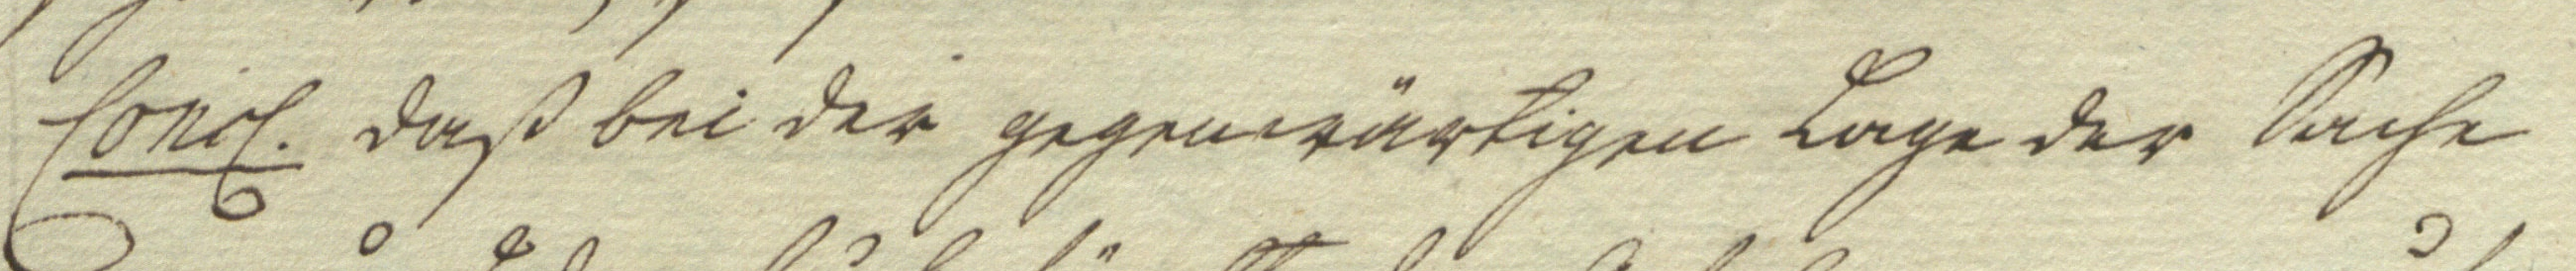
Concl. daß bei der gegenwärtigen Lage der Sache
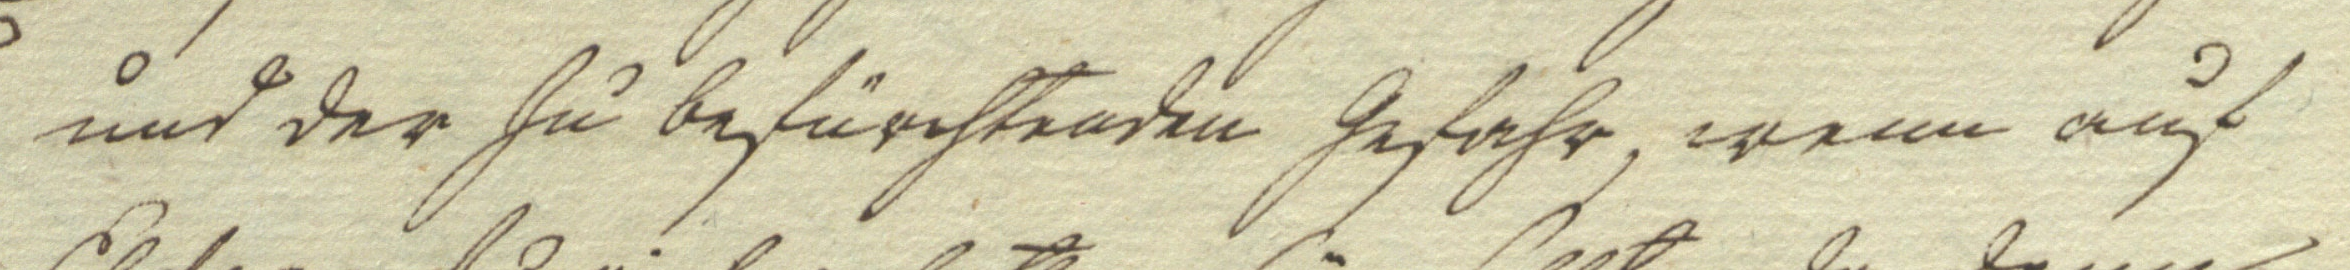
und der zu befürchtenden Gefahr, wenn auf
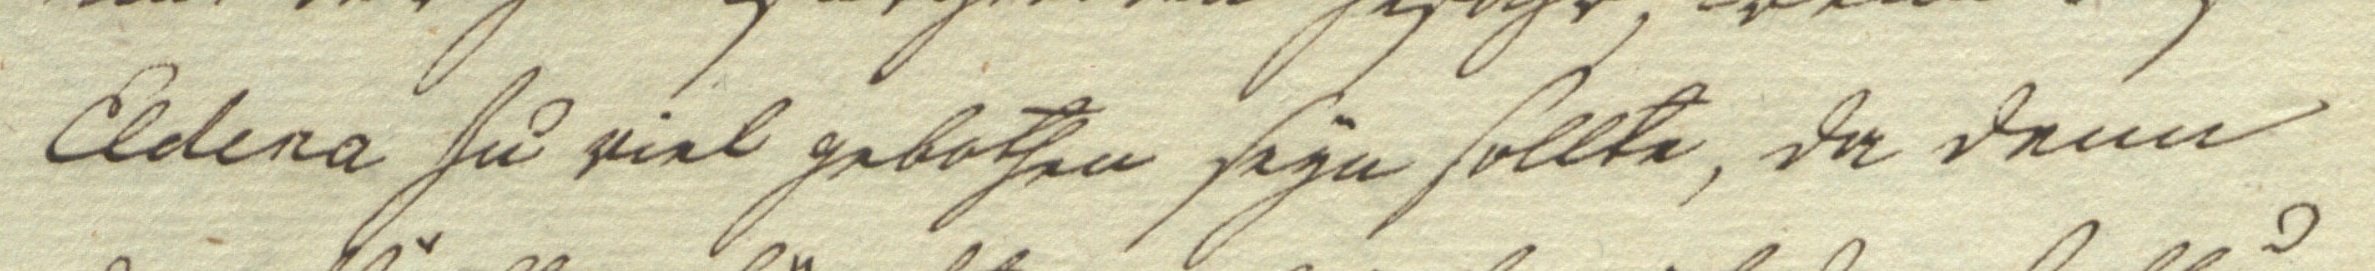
Eldena zu viel gebothen seÿn sollte, da denn
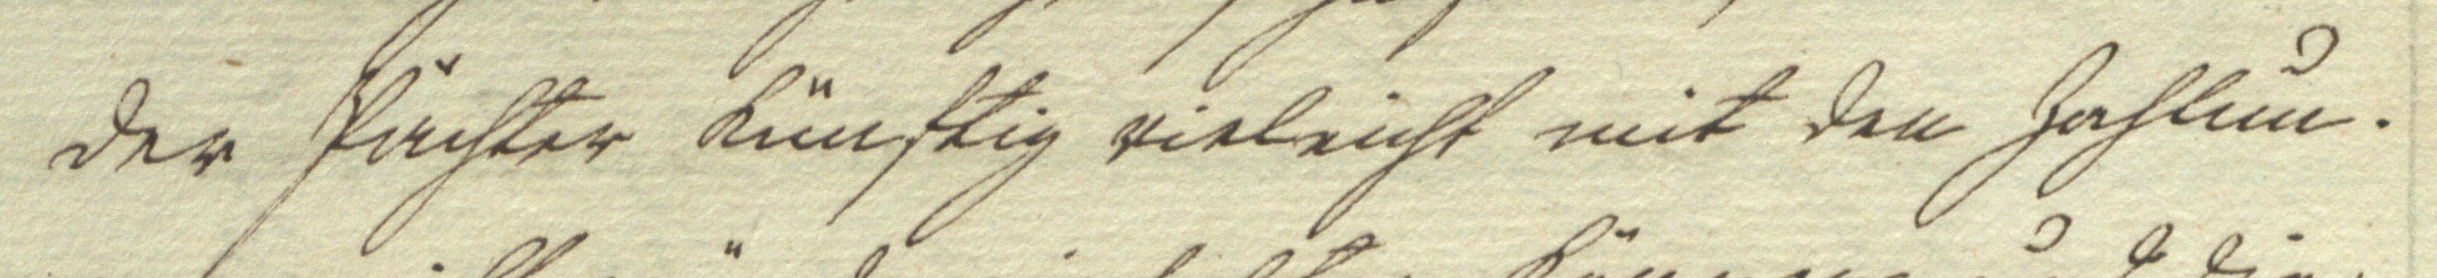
der Pächter künftig vieleicht mit den Zahlun¬
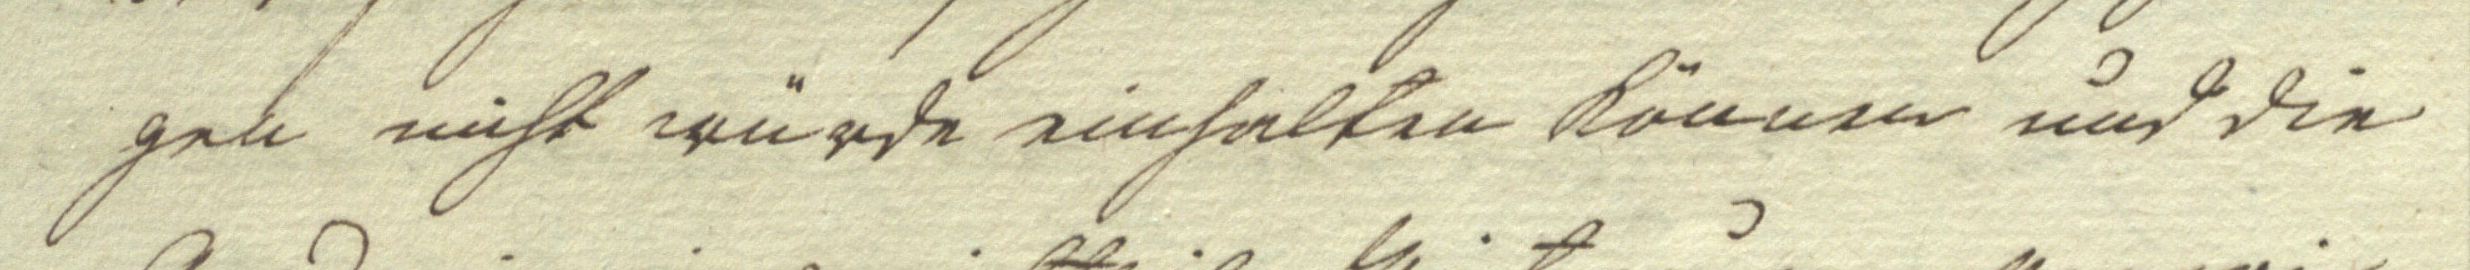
gen nicht würde einhalten können und die
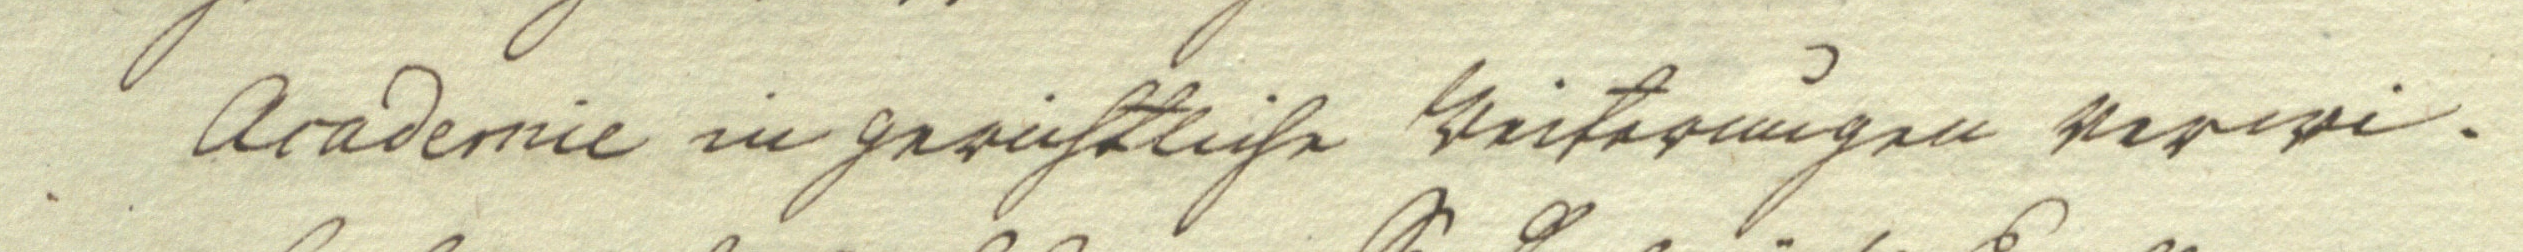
Academie in gerichtliche Weiterungen verwi¬
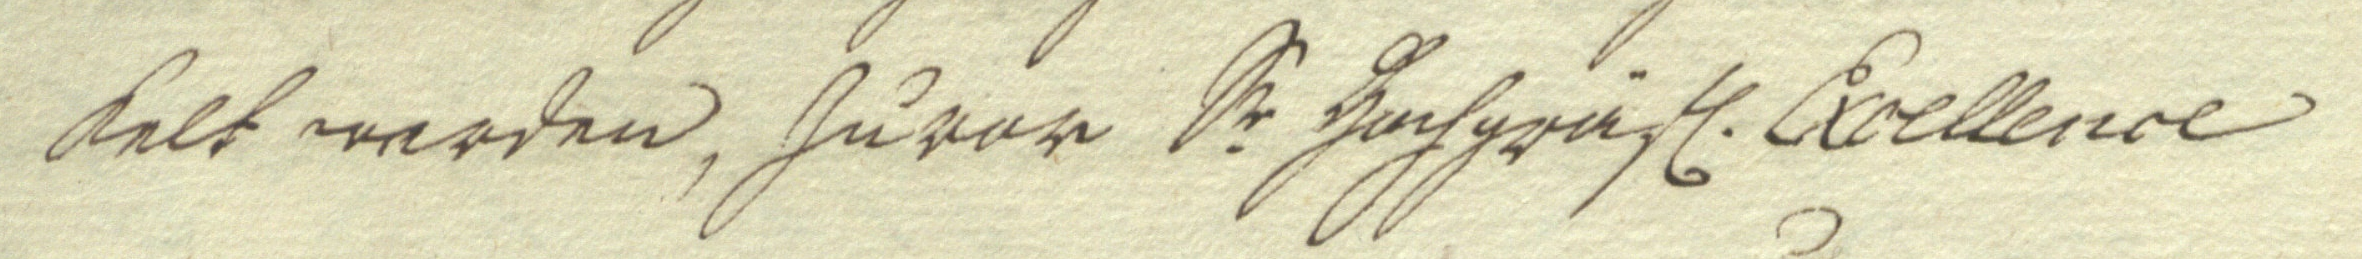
kelt werden, zuvor Sr Hochgräfl. Excellence
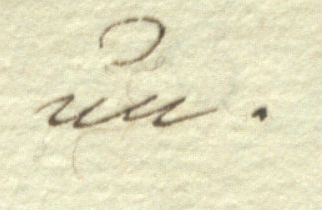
un
